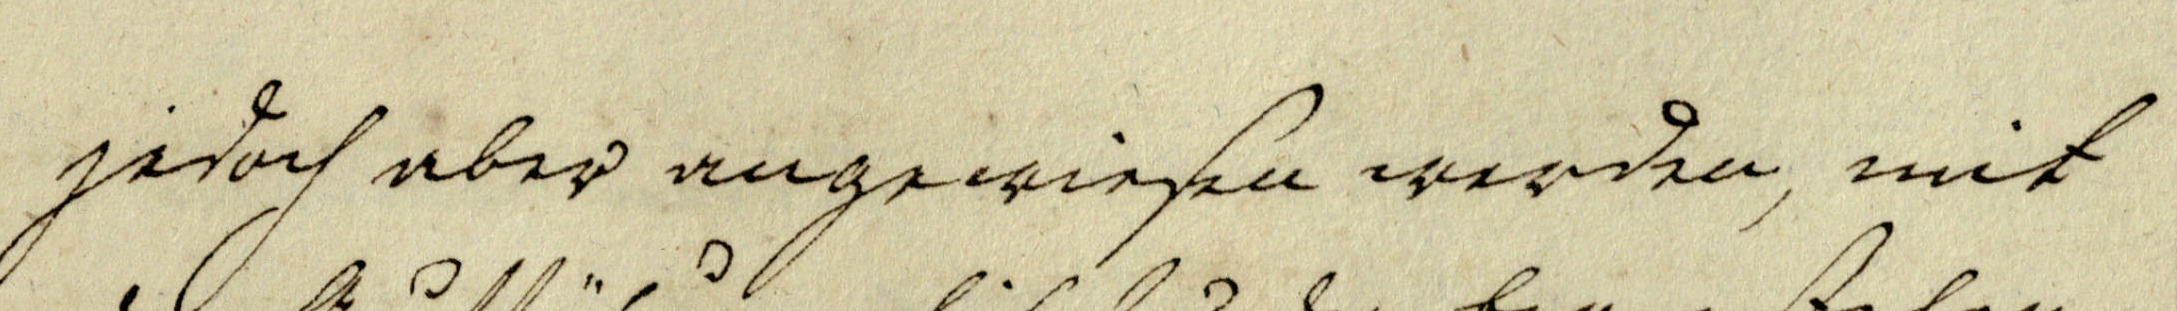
jedoch aber angewiesen werden, mit
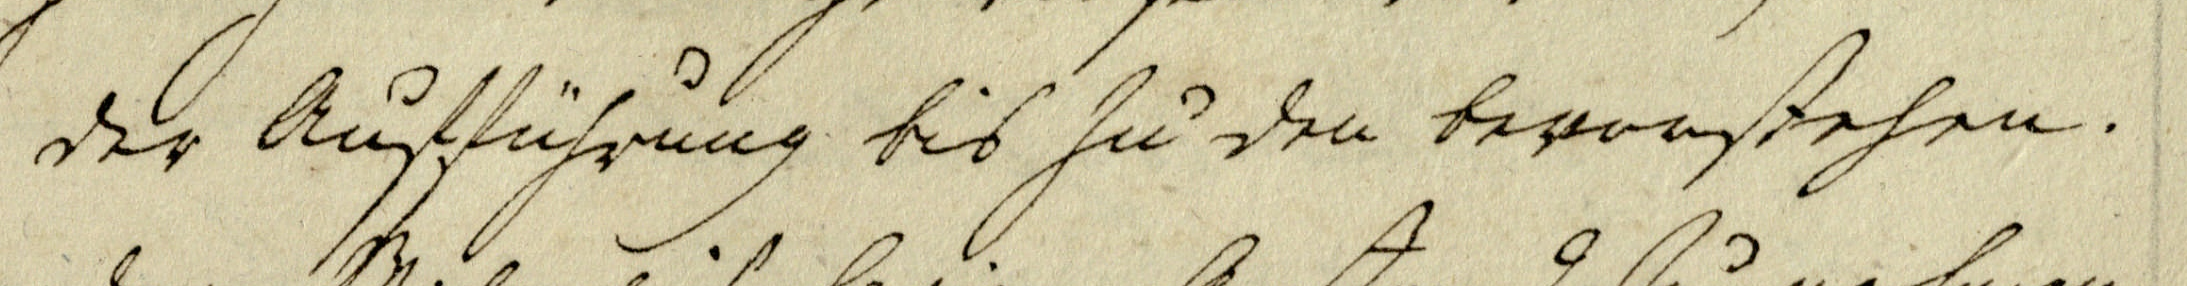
der Aufführung bis zu den bevorstehen¬
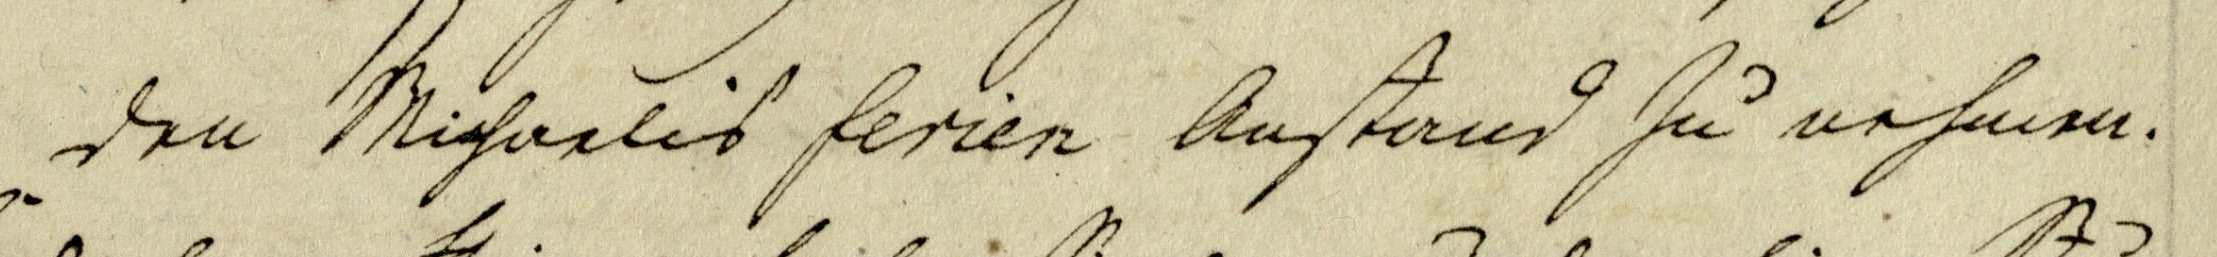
den Michaelis ferien Anstand zu nehmen.
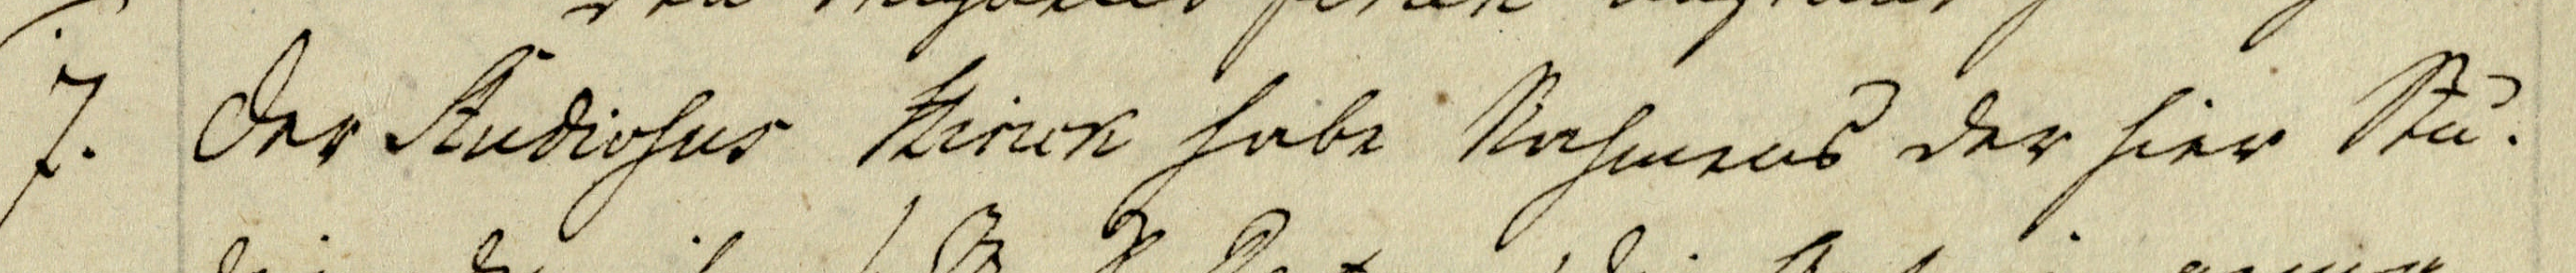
7. Der Studiosus Hinck habe Nahmens der hier Stu¬
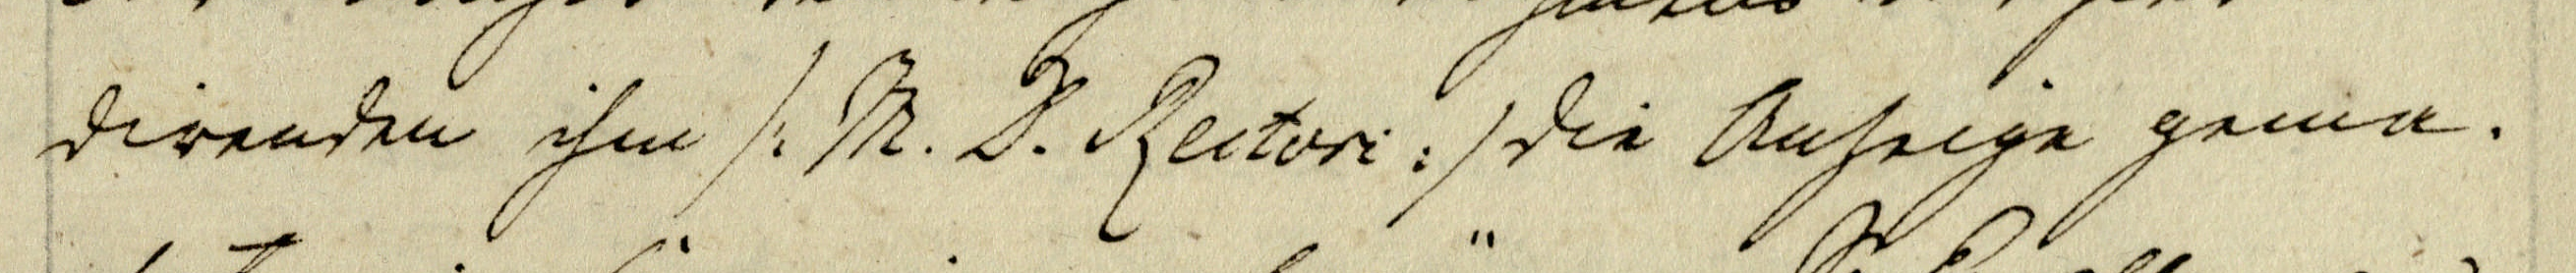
direnden ihm /. M. D. Rectori :/ die Anzeige gema¬
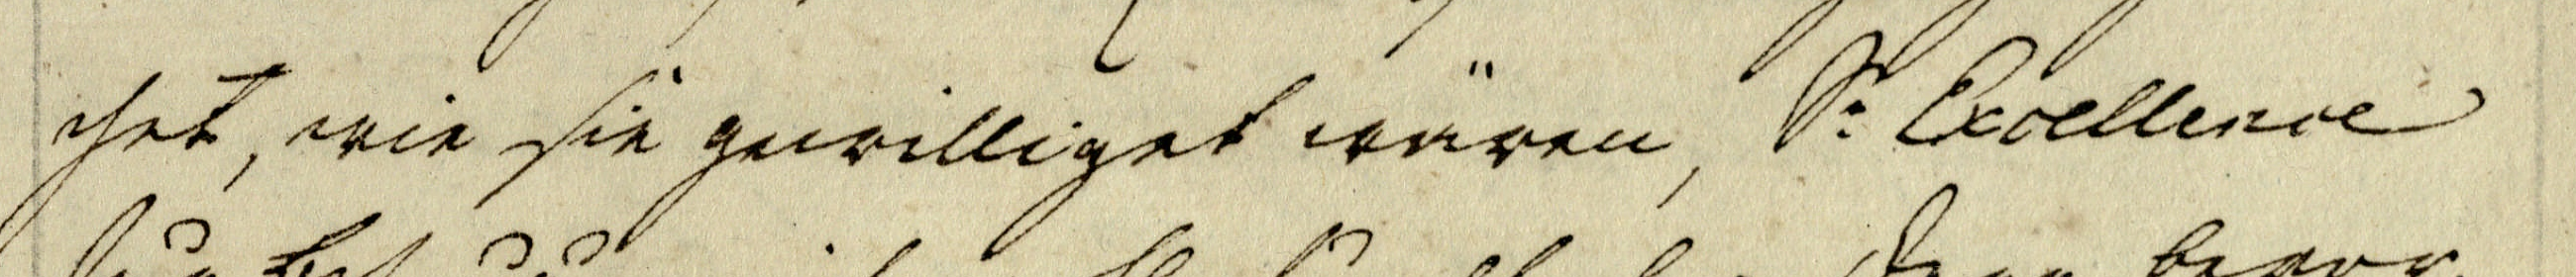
chet, wie sie gewilliget wären, Sr Excellence
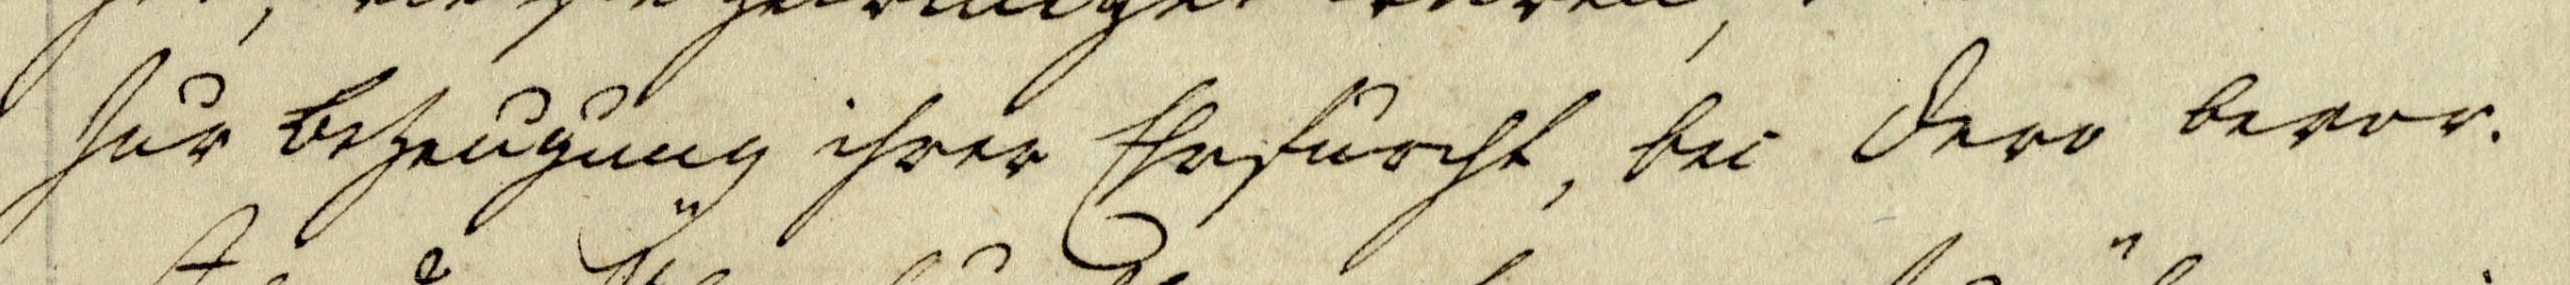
zur Bezeugung ihrer Ehrfurcht, bei dero bevor¬
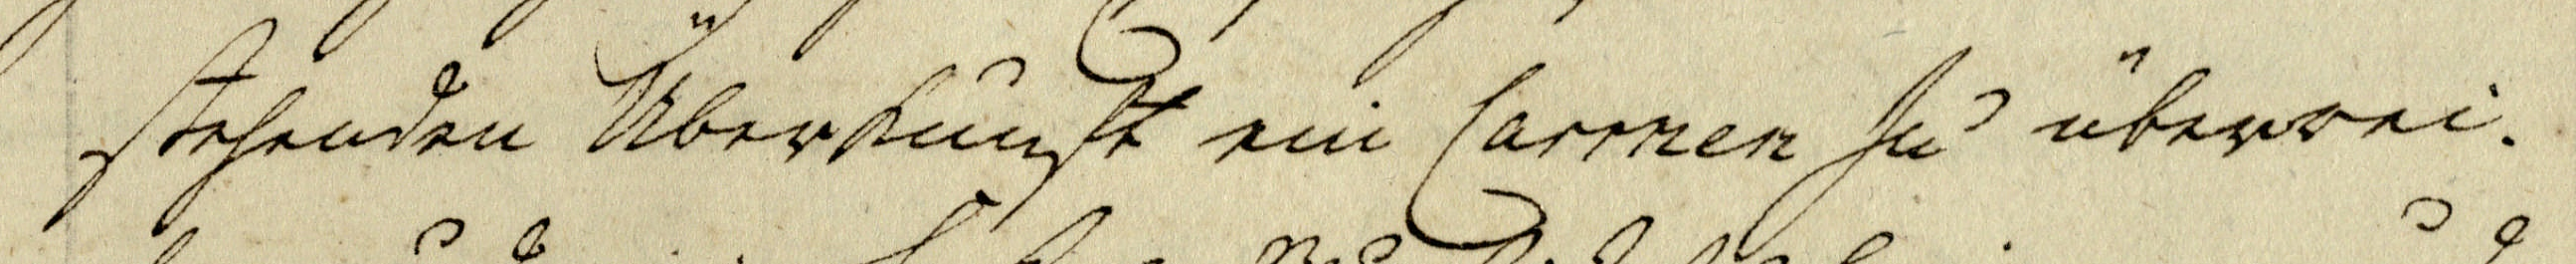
stehenden Überkunft ein Carmen zu überrei¬
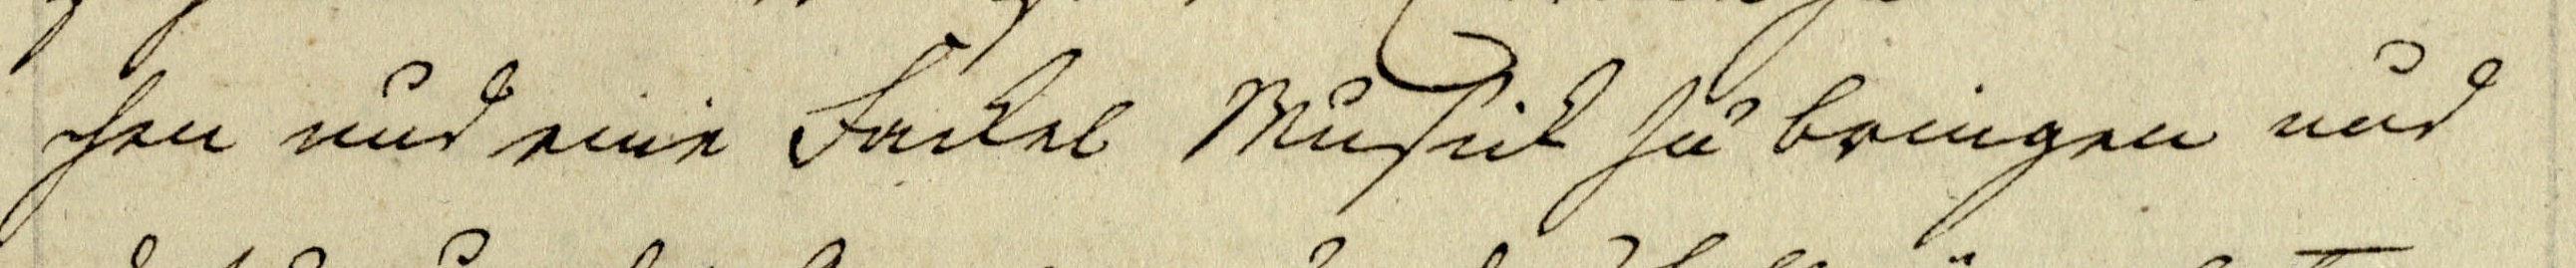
chen und eine Fackel Musick zu bringen und
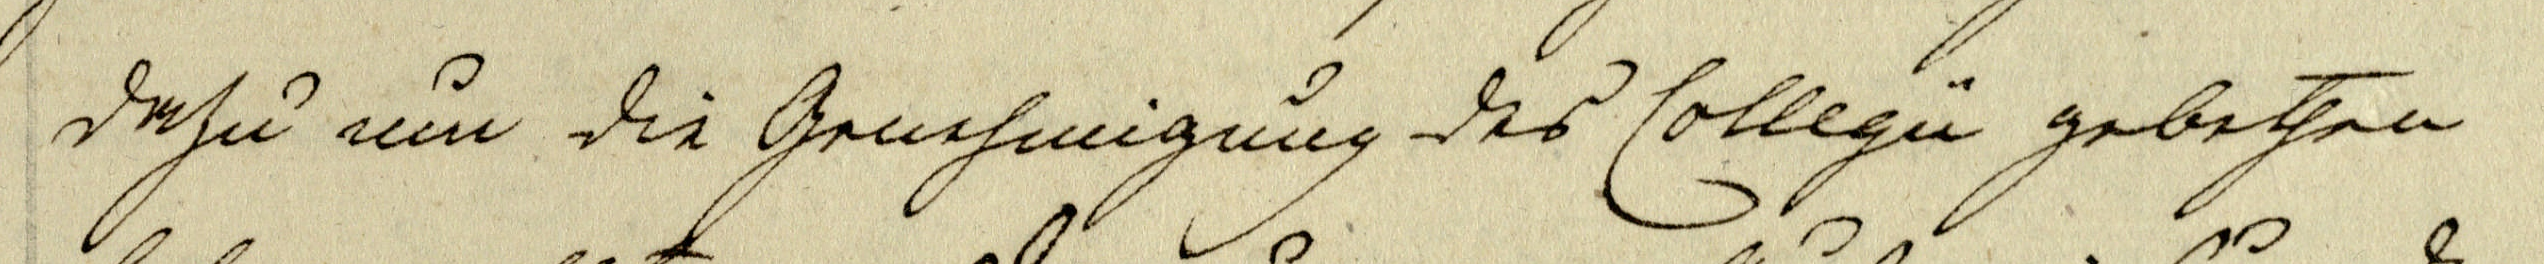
dazu um die Genehmigung des Collegii gebethen
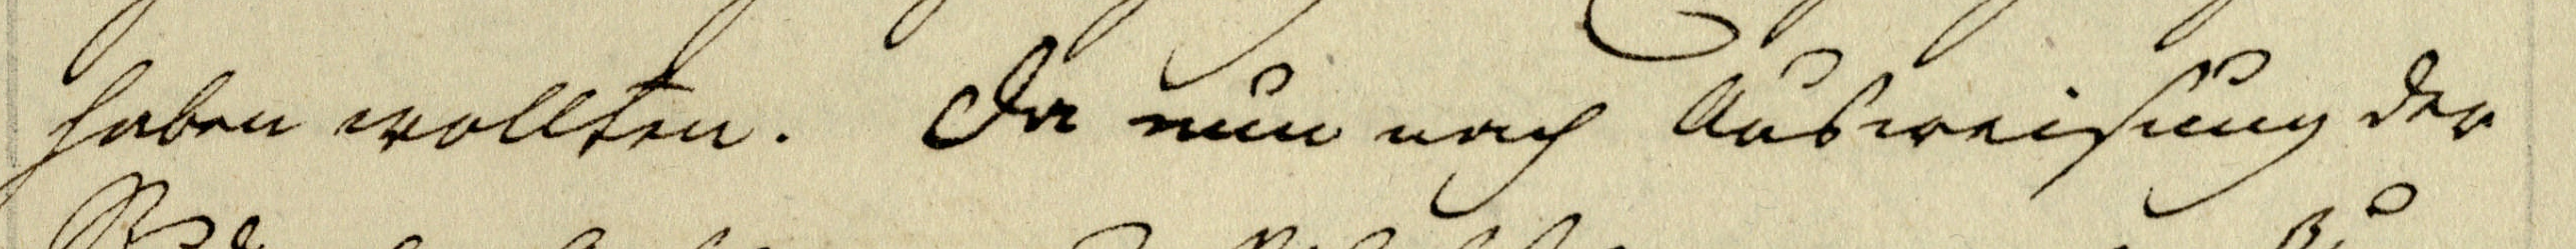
haben wollten. Da nun nach Ausweisung der
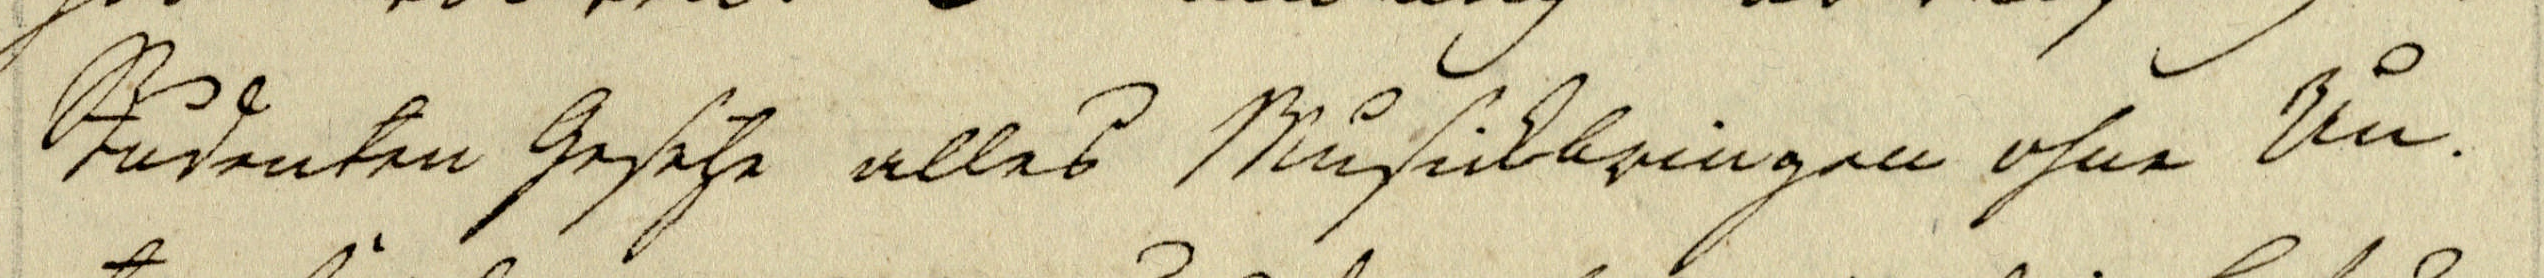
Studenten Gesetze alles Musickbringen ohne Un¬
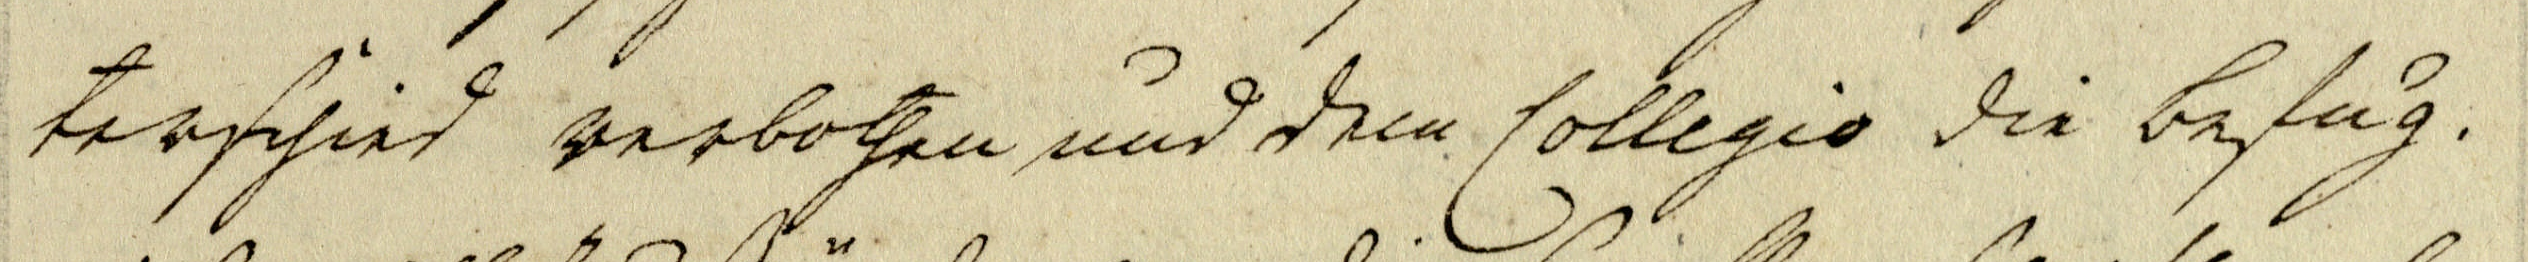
terschied verbothen und dem Collegio die Befug¬
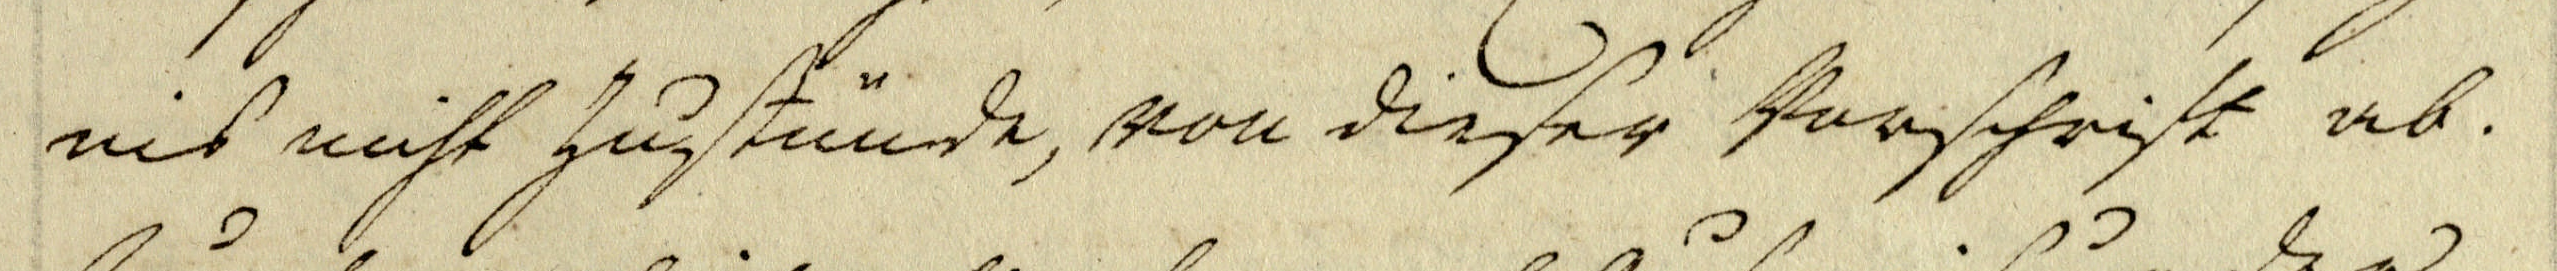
nis nicht zustünde, von dieser Vorschrift ab¬
